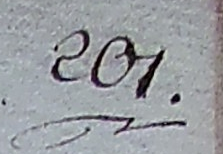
201.
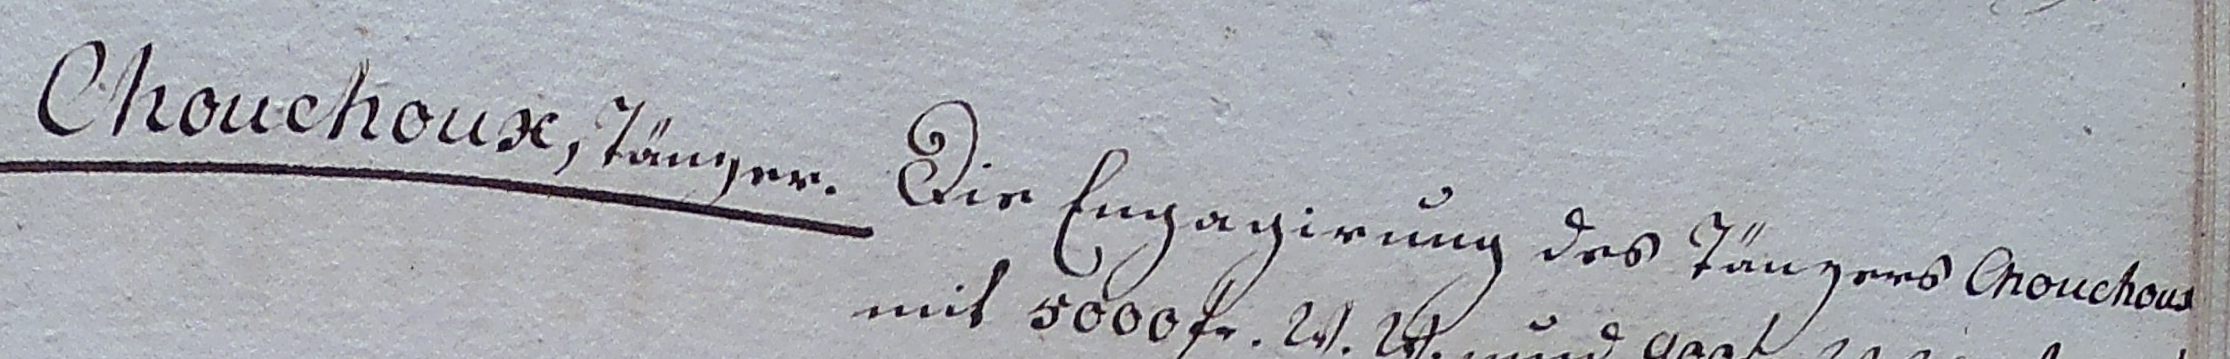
Chouchoux, Tänzer. Die Engagirung des Tänzers Chouchoux
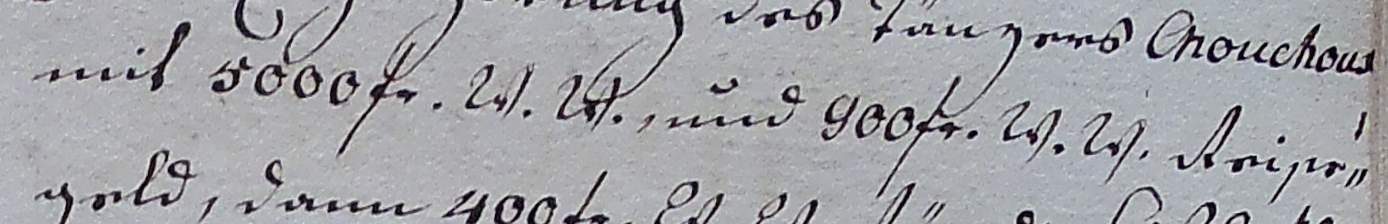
mit 5000fr. W.W., und 900fr. W.W. Reise¬
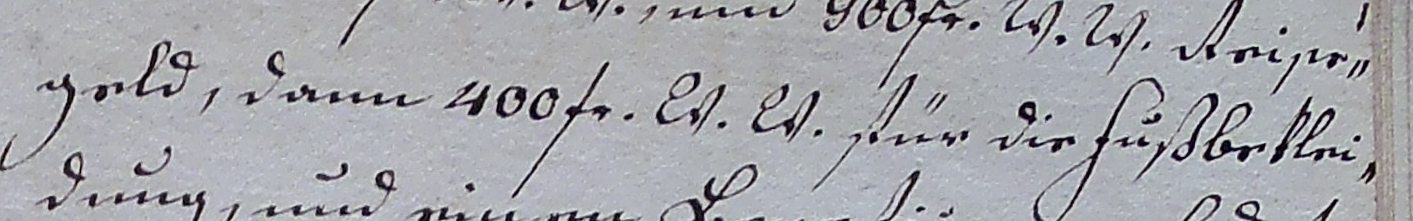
geld, dann 400fr. W.W. für die Fußbeklei,
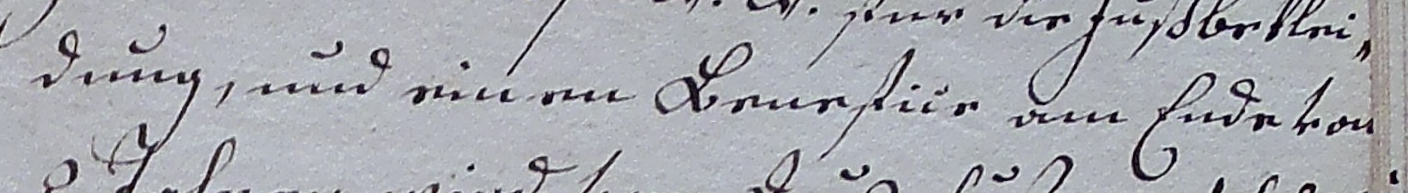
dung, und einen Benefice am Ende von
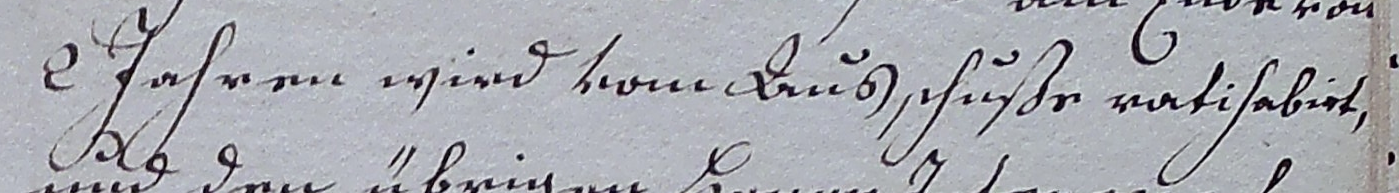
2 Jahren wird vom Ausschuße ratihabirt,
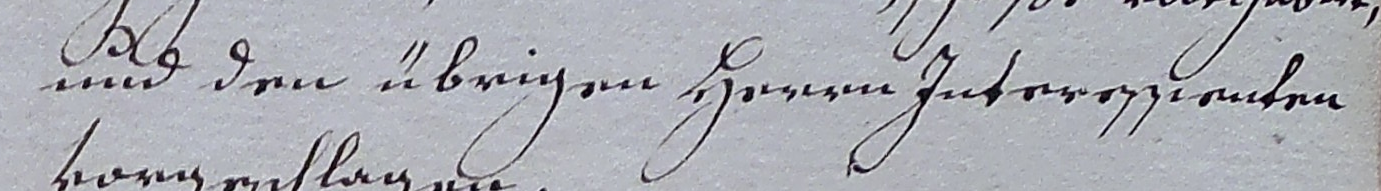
und den übrigen Herrn Interessenten
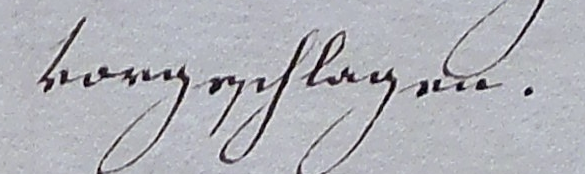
vorgeschlagen.
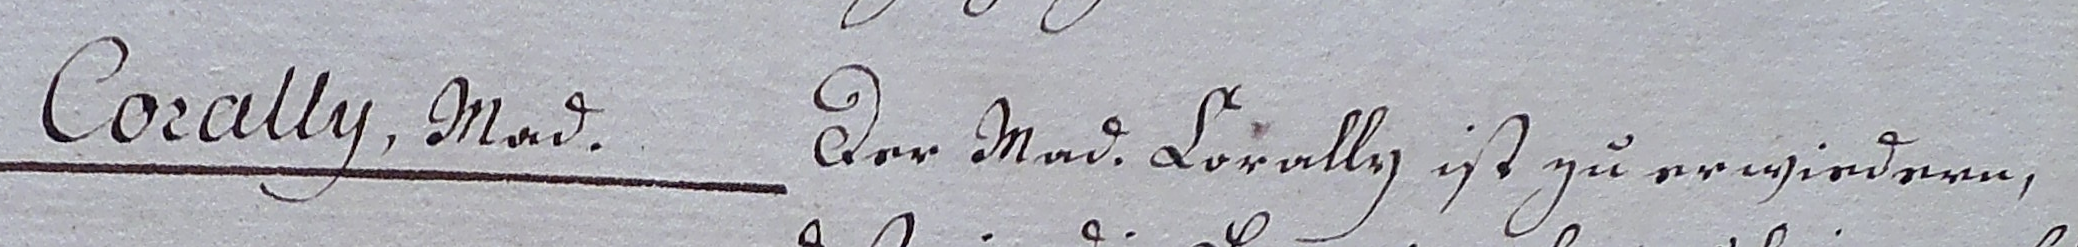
Corally, Mad. Der Mad. Corally ist zu erwiedern,
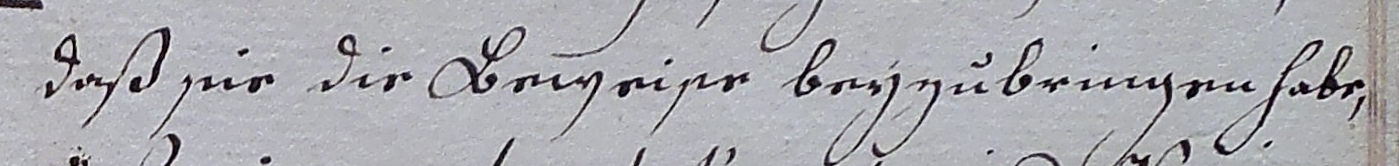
daß sie die Beweise beyzubringen habe,
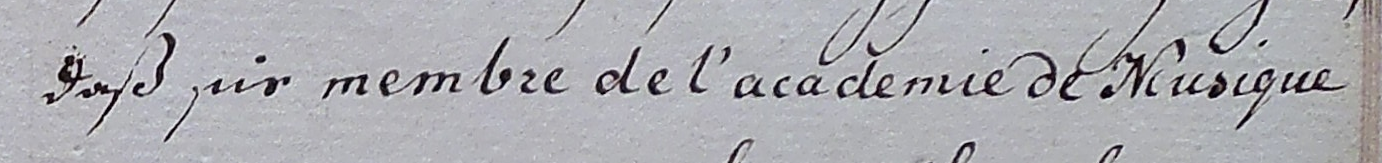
daß sie membre del' academie de Musique
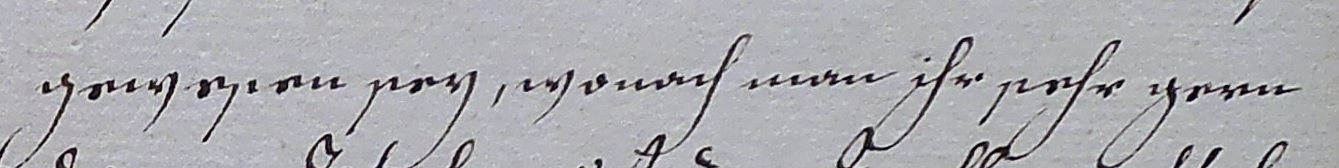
gewesen sey, wonach man ihr sehr gern
